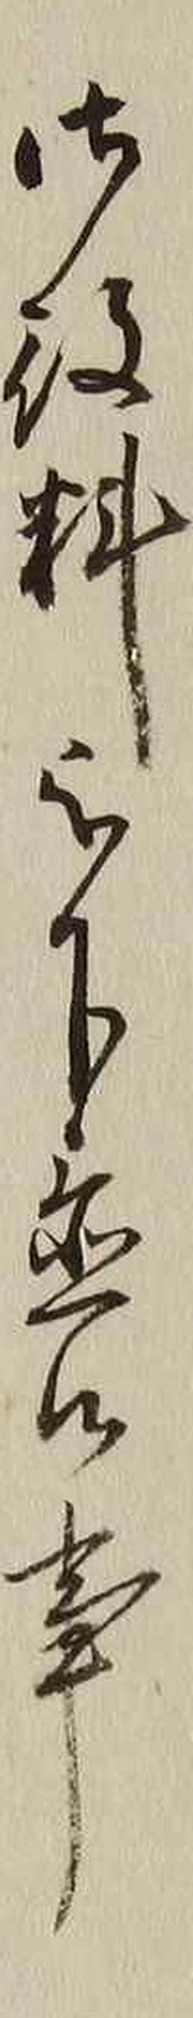御役料被下置候事
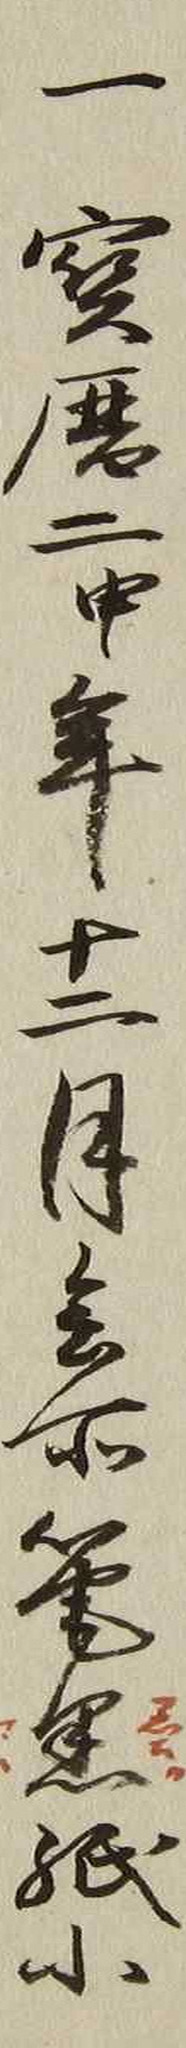一宝暦二申年十二月会所筆黒紙小
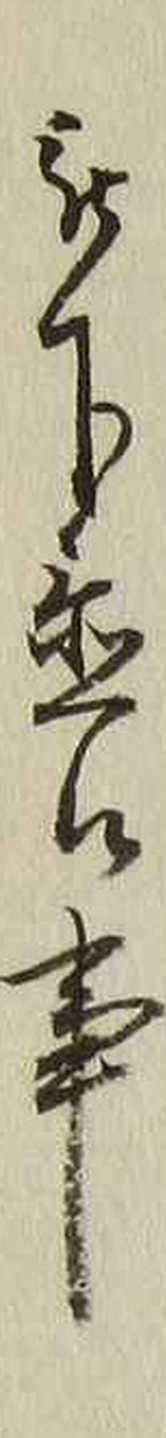被下置候事
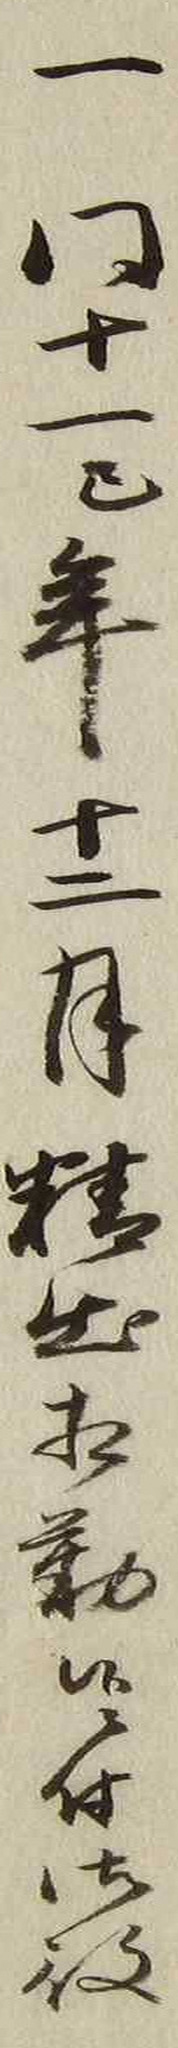一同十一巳年十二月精出相勤候ニ付御役
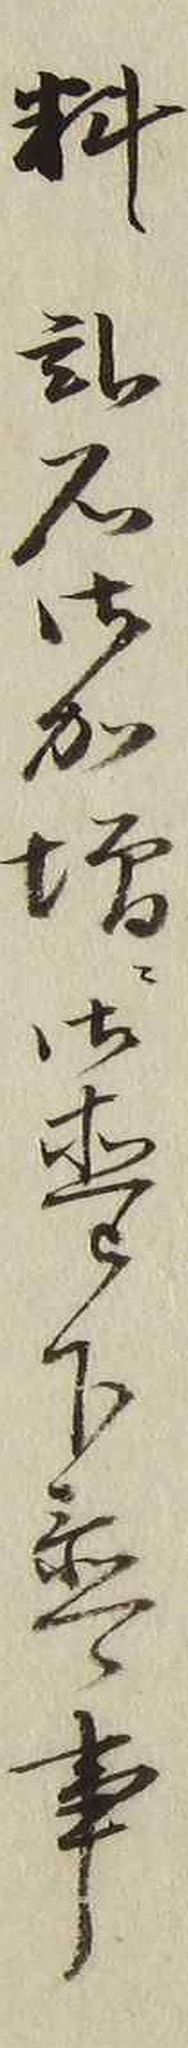料弐石御加増ニ御直被下置候事
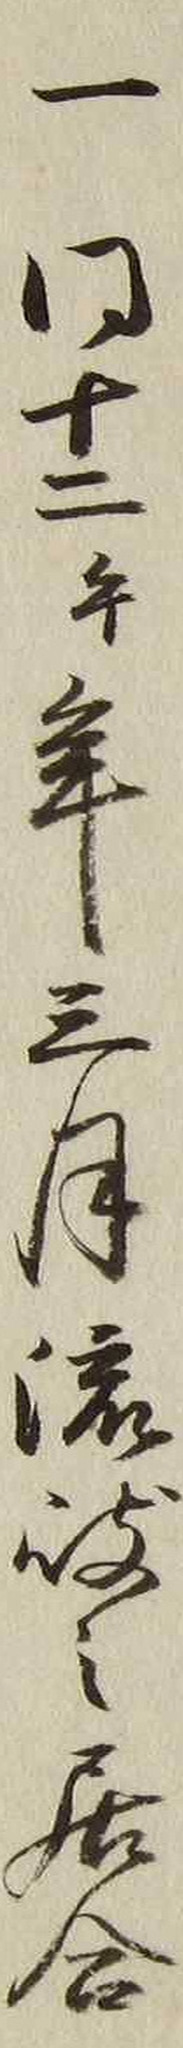一同十二午年三月流岐之居合
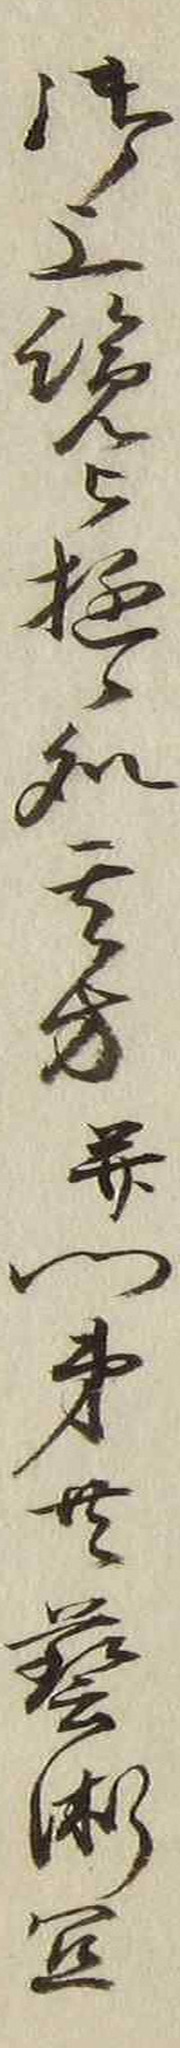御上覧被遊候処其方并門弟共芸術宜
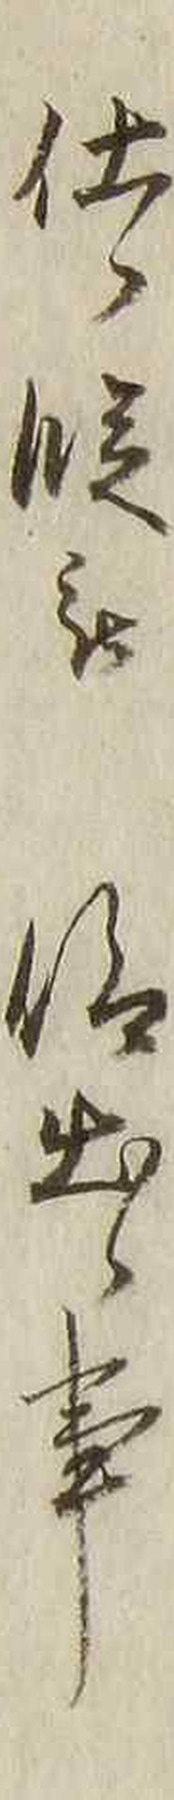仕候段被仰出候事
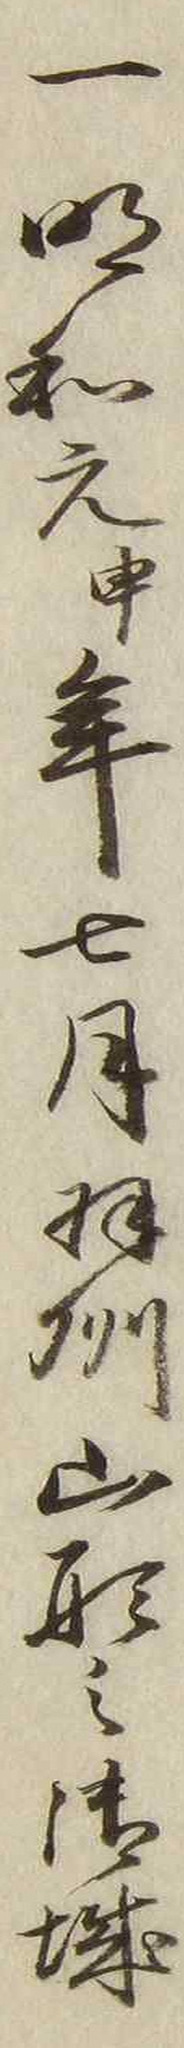一明和元申年七月羽州山形之御城

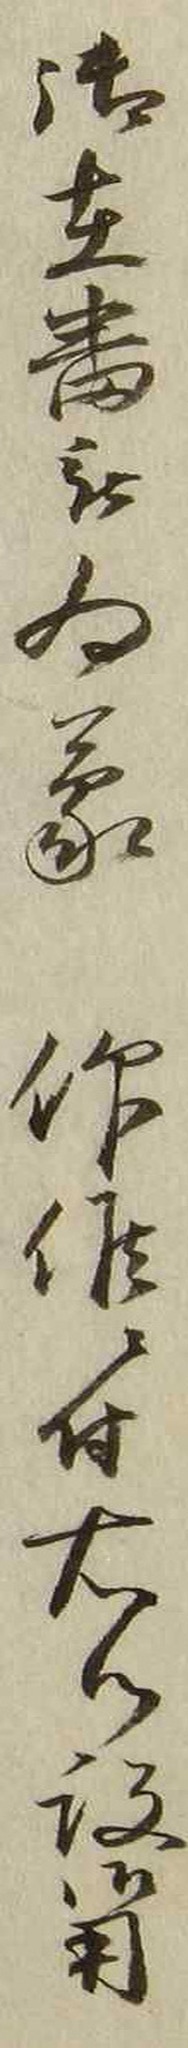御在番被為蒙仰候ニ付右御役御用
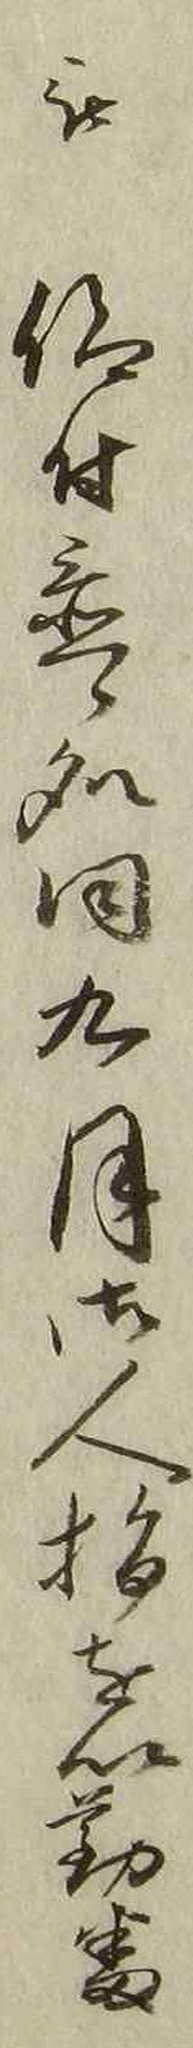被仰付置候処同九月御人指を以勤番
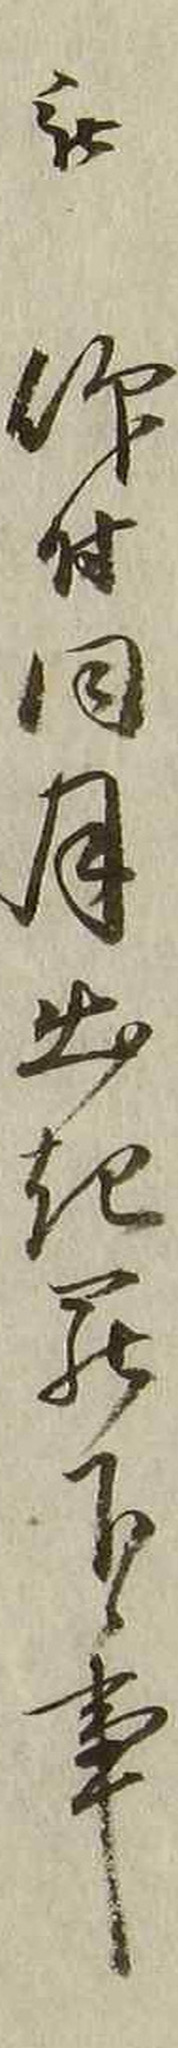被仰付同月出起罷下候事
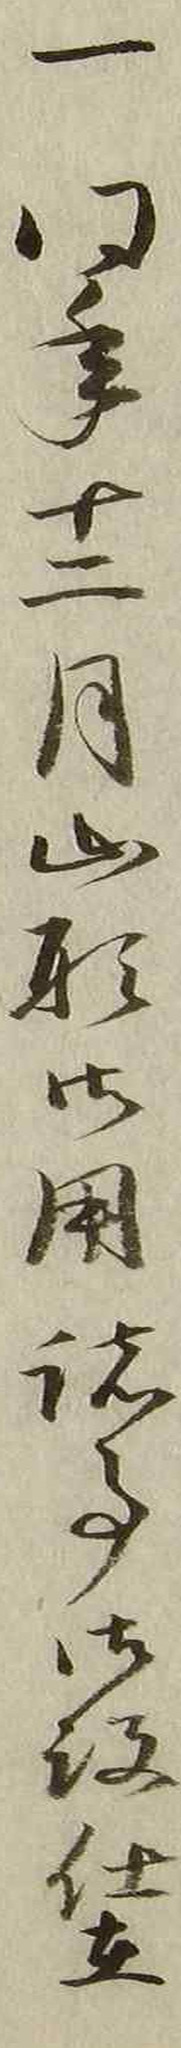一同年十二月山形御用諸事御役仕在
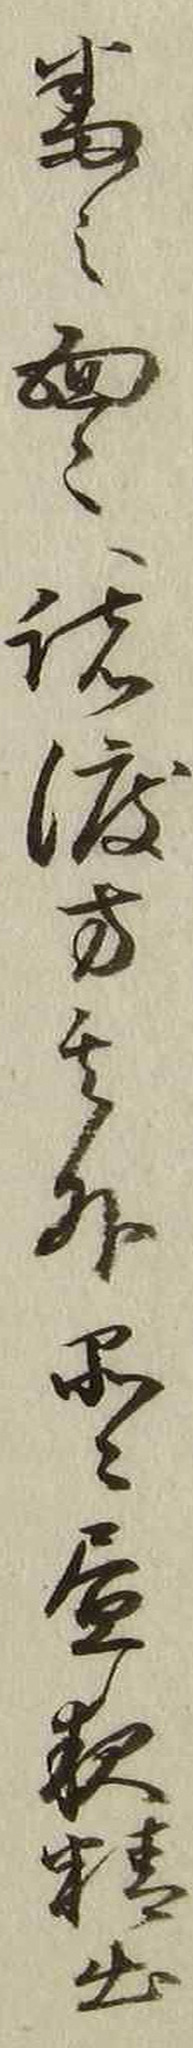番之面々へ諸渡方其外品々昼夜精出
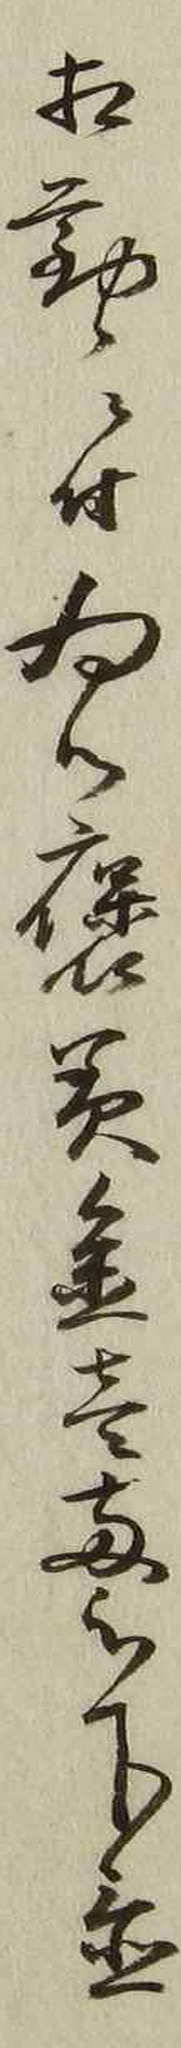相勤候ニ付為御褒美金壱両被下置
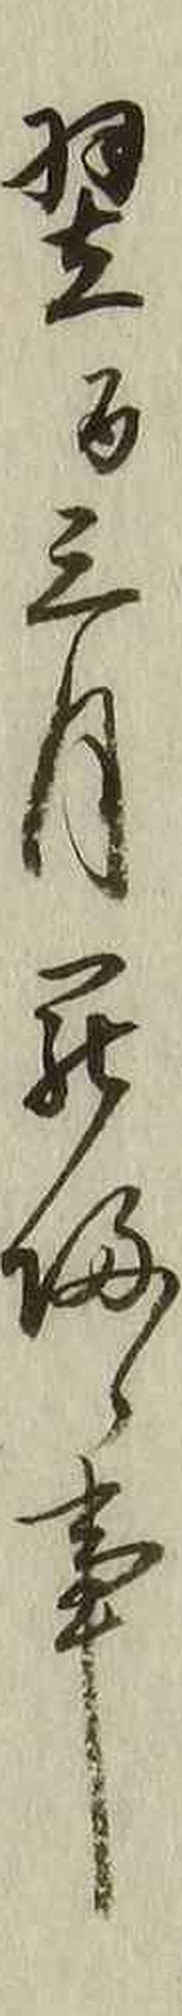翌酉三月罷帰候事
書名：諸士系譜　巻之102　か之部10
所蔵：会津若松市立会津図書館
